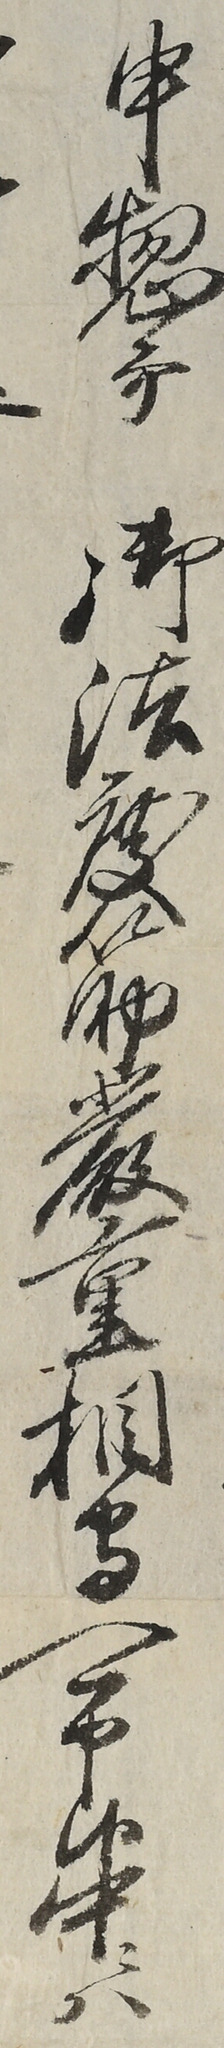申惣而御法度筋厳重相守可申候中ニハ
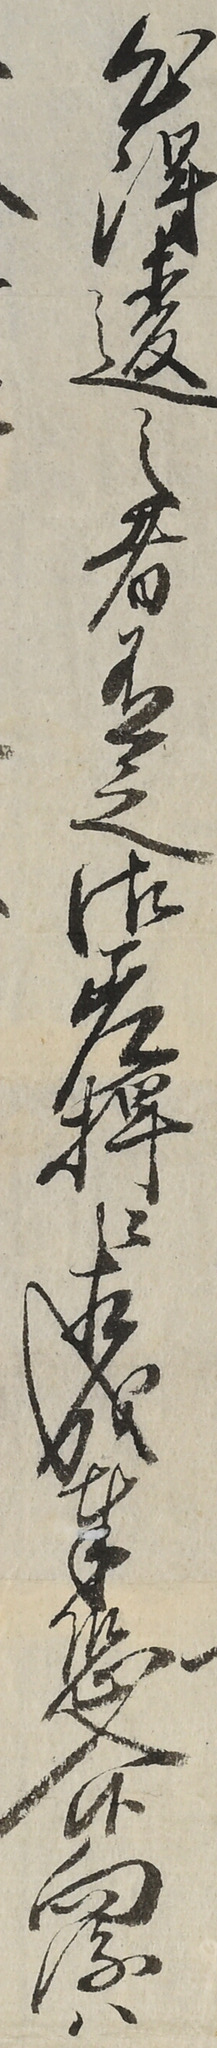心得違之者有之御差押ニ相成奉恐入候向後ハ
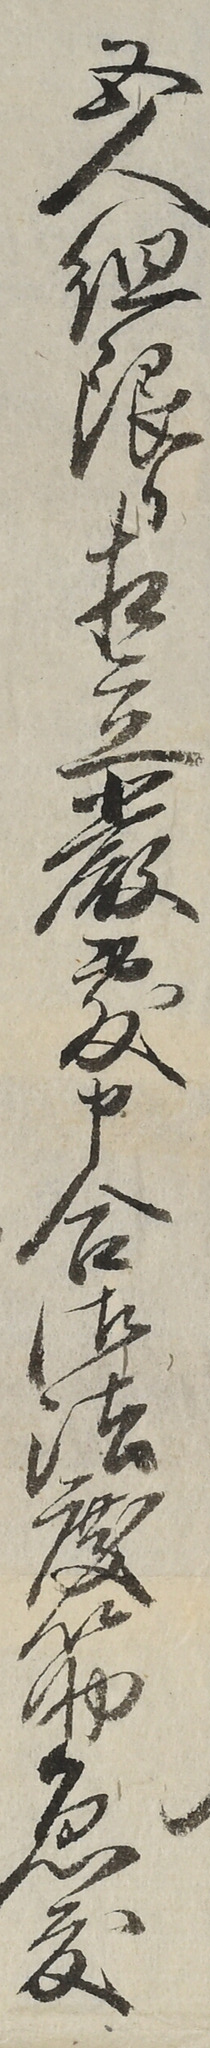五人組限り相立厳敷申合御法度筋急度
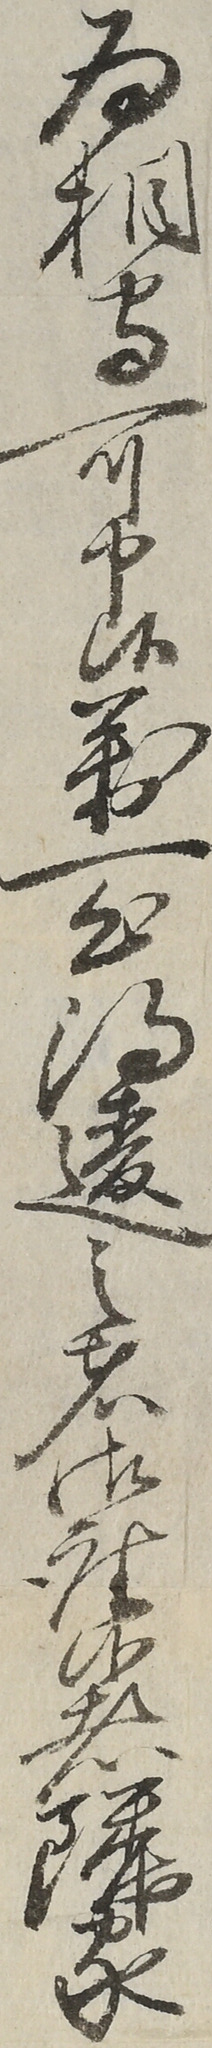為相守可申候万一心得違之者御座候者隣家
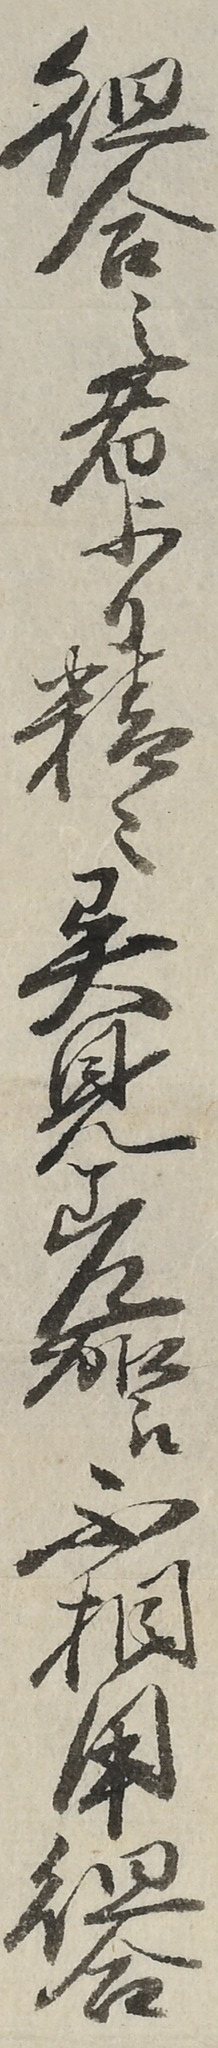組合之者より精々異見差加江不相用組合
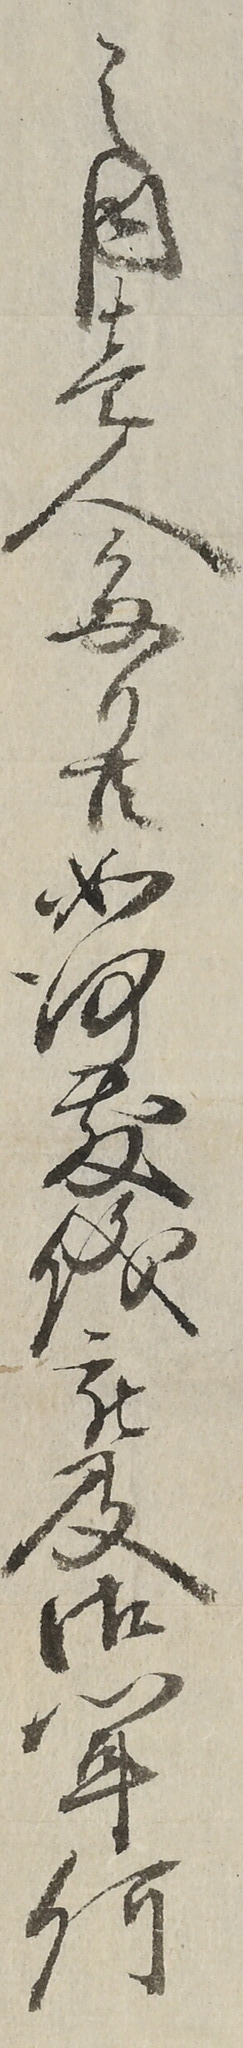之内壱人たり共如何敷儀被及御聞何
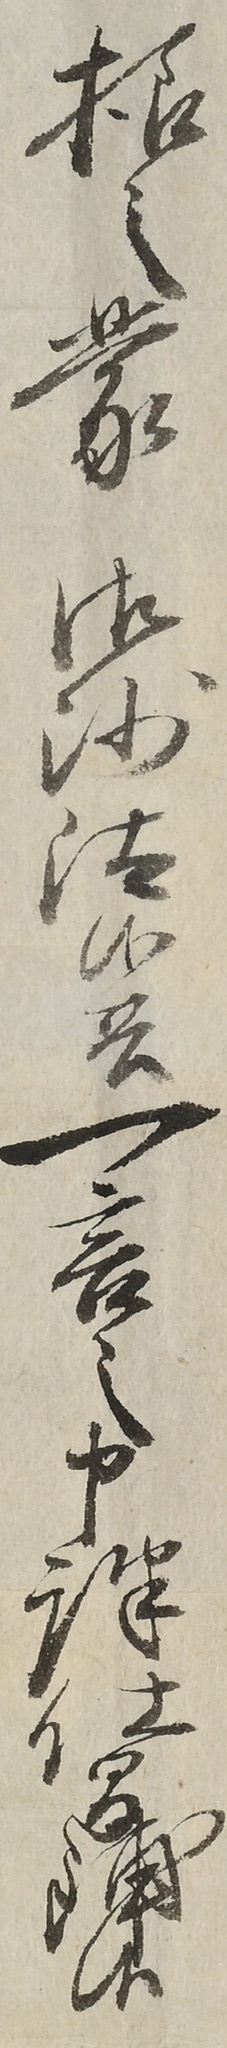様之蒙御沙汰候共一言之申訳仕間鋪候
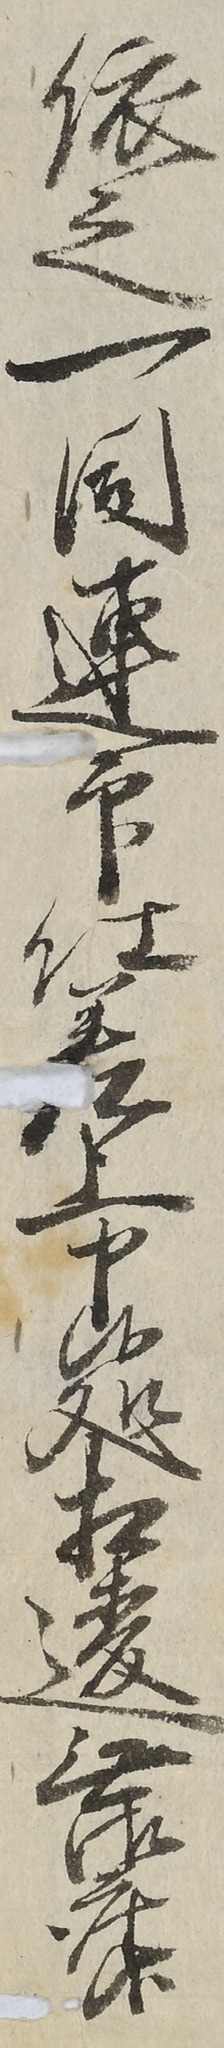依之一同連印仕差上申候処相違無御座候
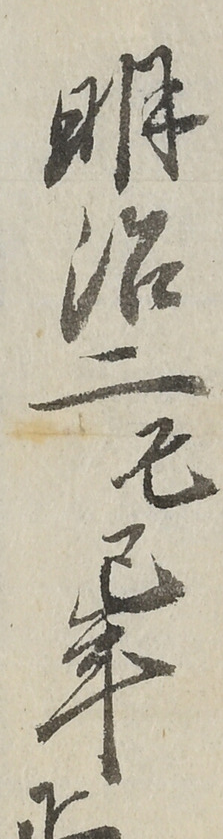明治二己巳年
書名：差上申一札之事
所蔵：伊那市立高遠町図書館・合同会社AMANE
